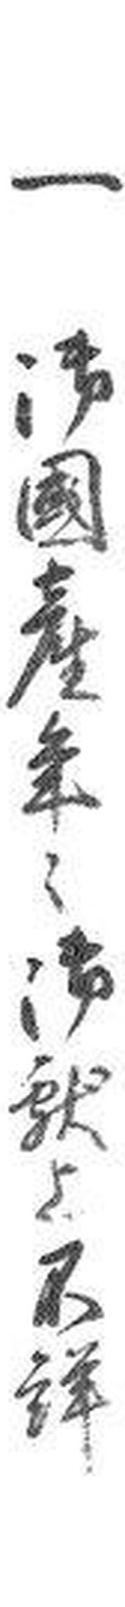一御国産年々御献上不詳
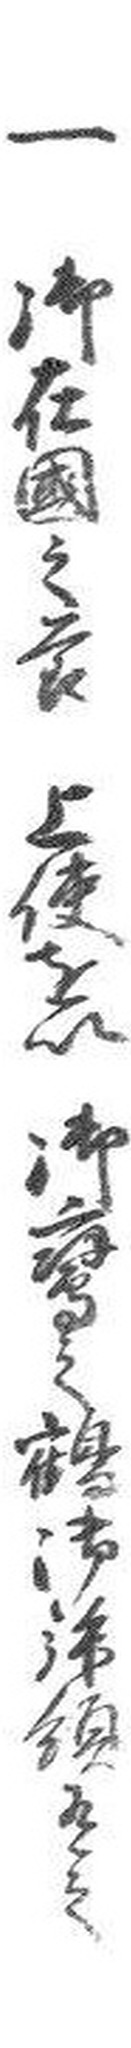一御在国之節上使を以御鷹之鶴御拝領有之
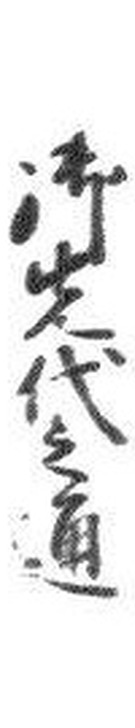御纏御先代之通
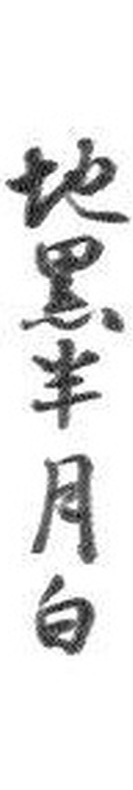御旗地黒半月白
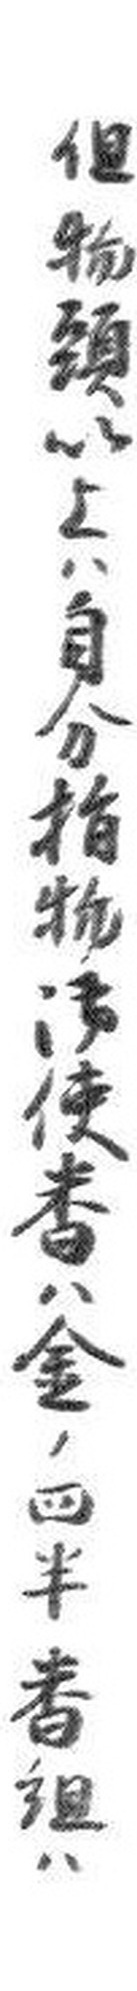但物頭以上ハ自分指物御使番ハ金ノ四半番組ハ
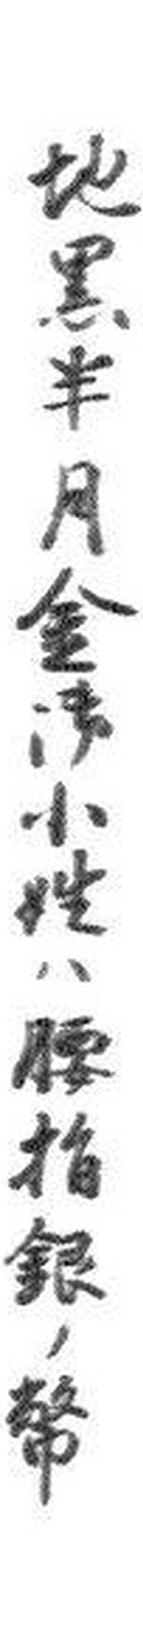地黒半月金御小姓ハ腰指銀ノ幣
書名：家譜 四 忠昌公 従寛永七年到正保四年
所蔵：福井県文書館 Fukui Prefectural Archives
